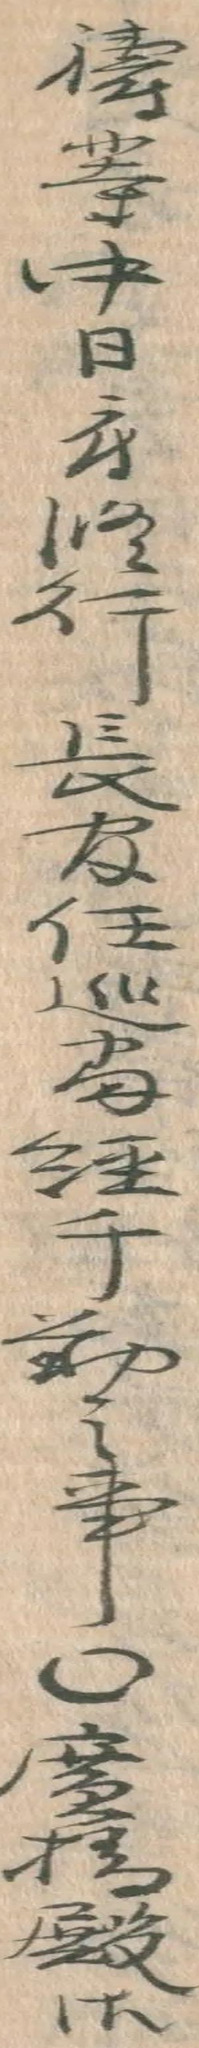禱等中日ニ付修行長官任巡番経千勤之事〇廣橋殿御
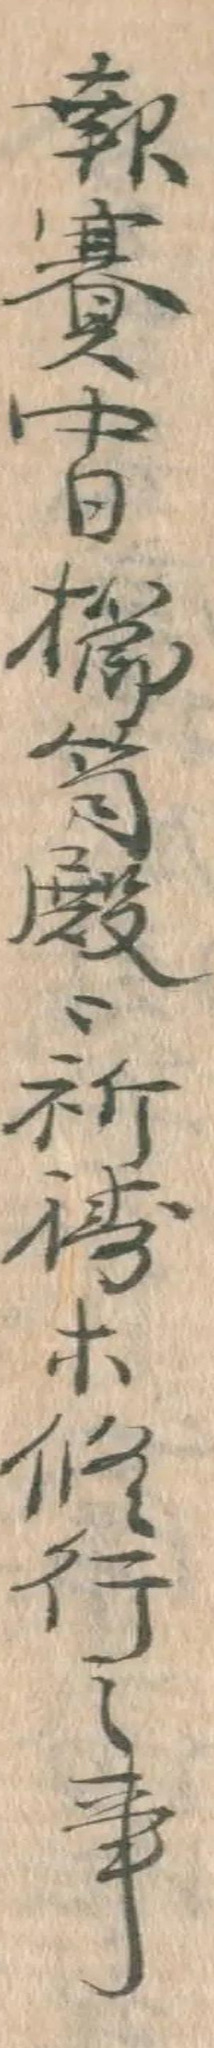報賽中日櫛笥殿御祈禱等修行之事
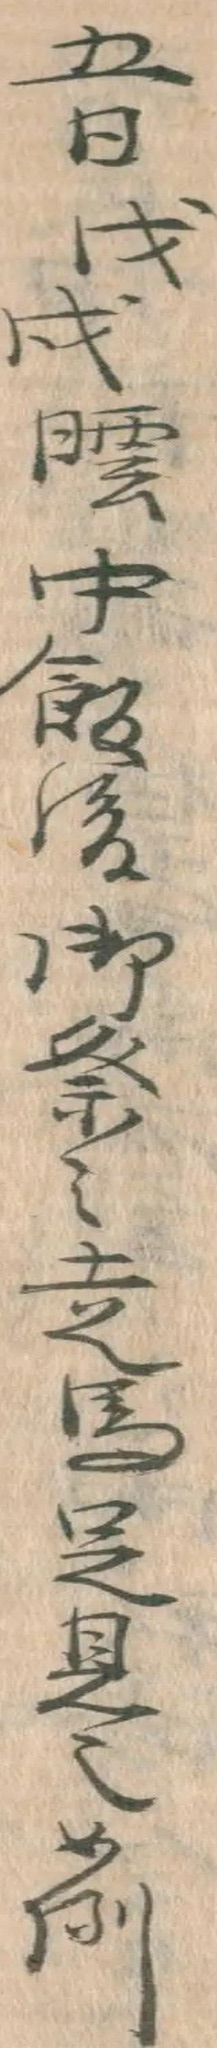五日戊戌曇中飯後御祭之走馬足見也如例
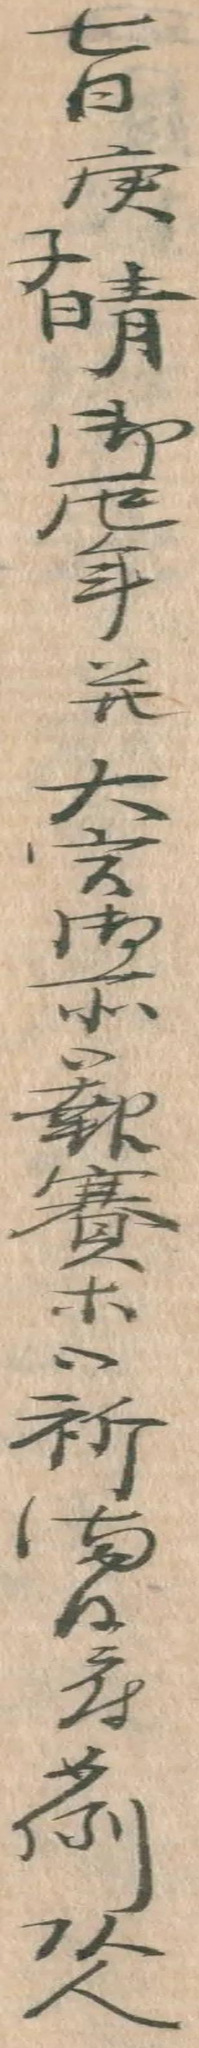七日庚子晴御厄年並大宮御所御報賽等御祈満日ニ付如例頭人
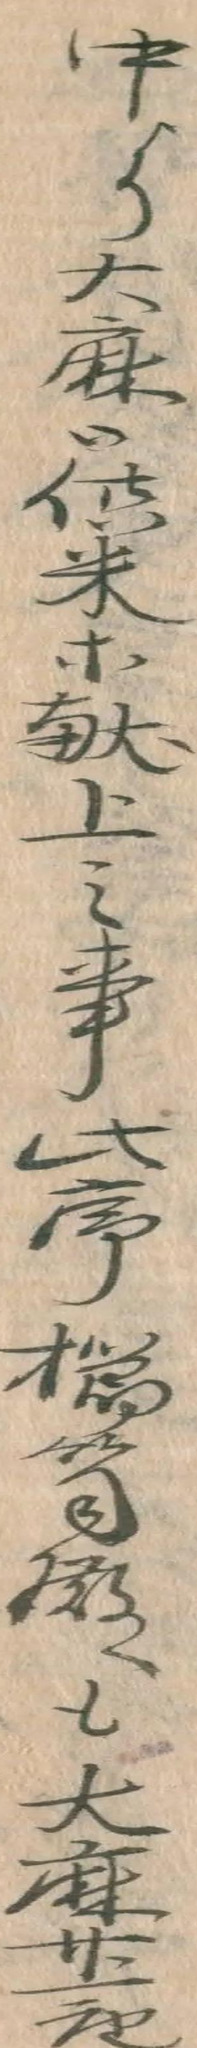中より大麻御供米等献上之事此序櫛笥殿へも大麻廿一座
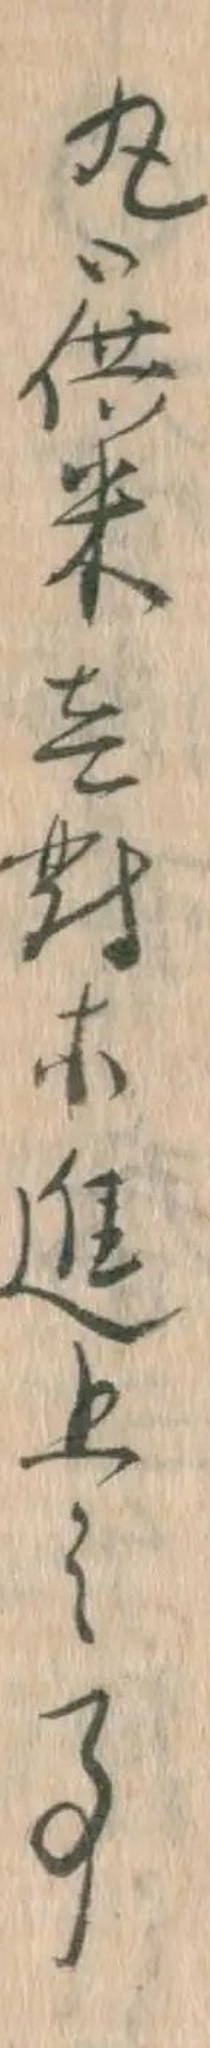丸御供米壱対等進上之事
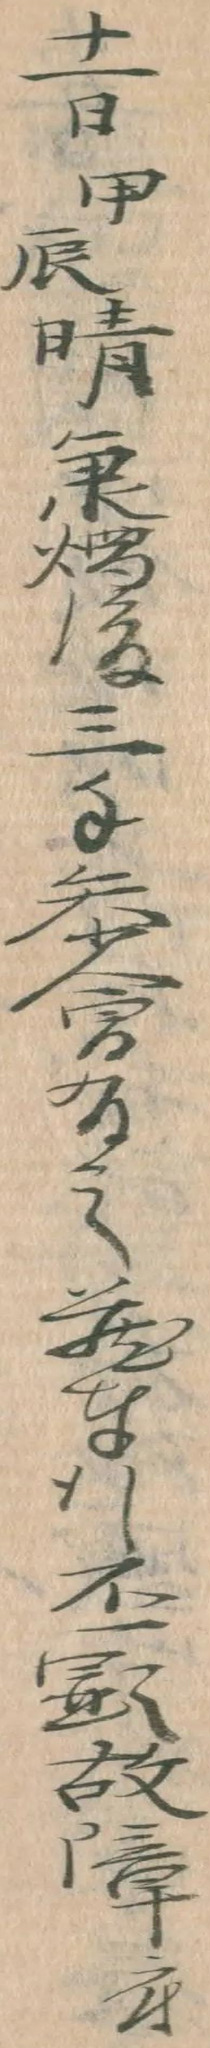十一日甲辰晴秉燭後三手参会有之蔵奉行丕顕故障ニ付
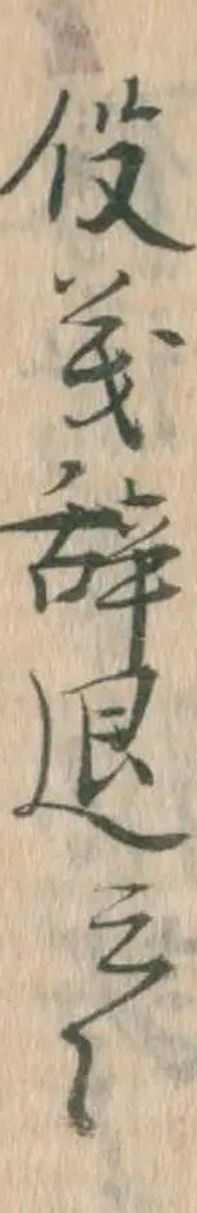役義辞退云々
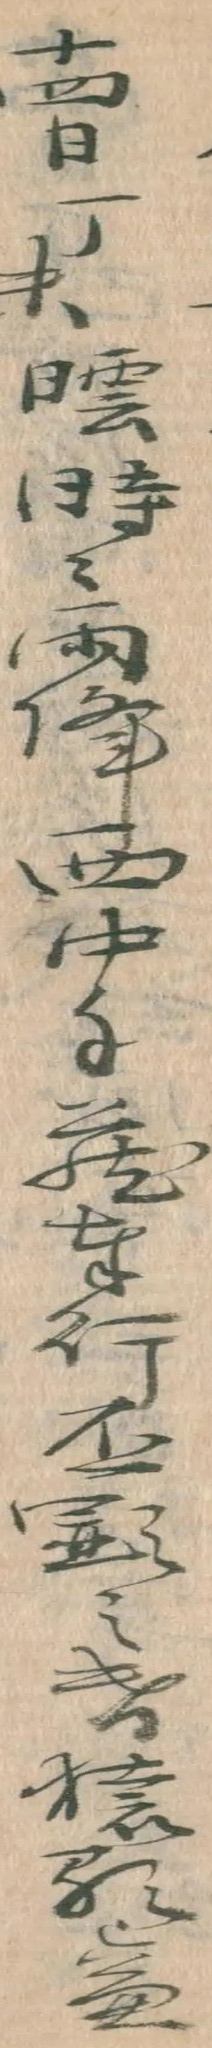十四日丁未曇時々雨降西中手蔵奉行丕顕之替猿顕被兼
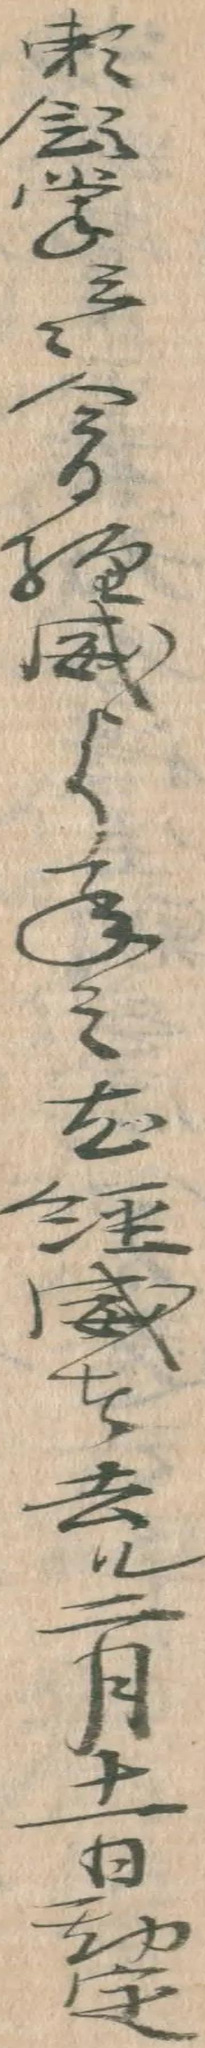頼領掌云々今日経威より承之尤経威者去ル二月十一日勘定
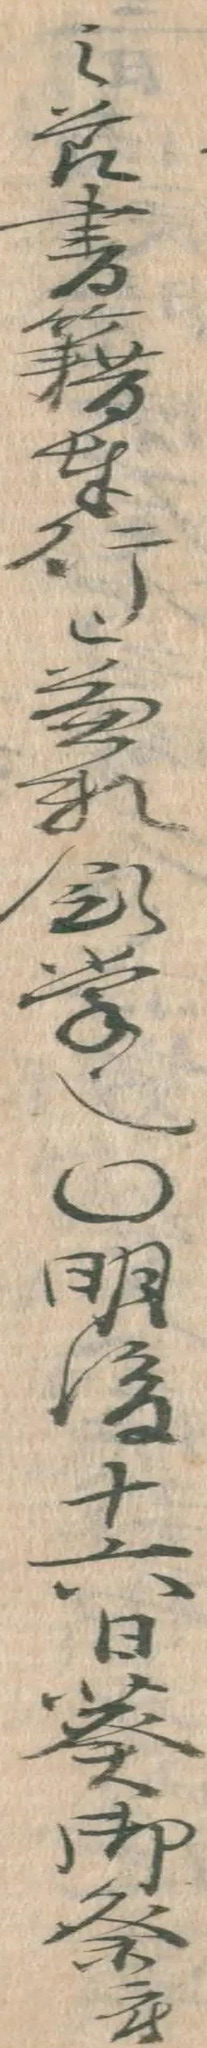之節書籍奉行被兼頼領掌也○明後十六日葵御祭ニ付
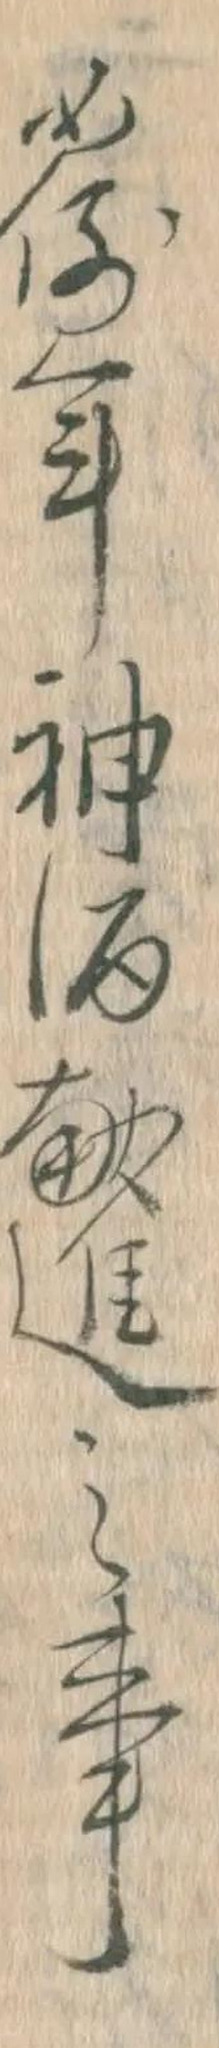如例年神酒献進之事
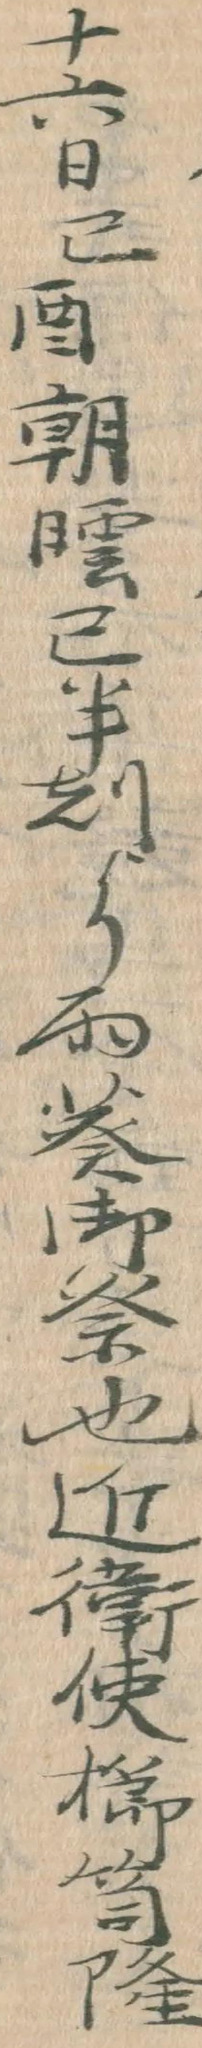十六日己酉朝曇巳半刻より雨葵御祭也近衛使櫛笥隆
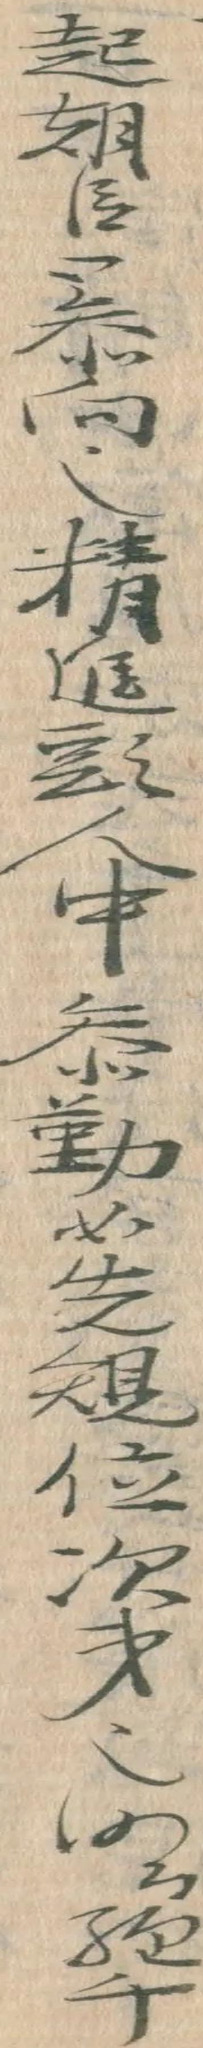起朝臣御参向也精進頭人中参勤如先規位次第也仍而約経干
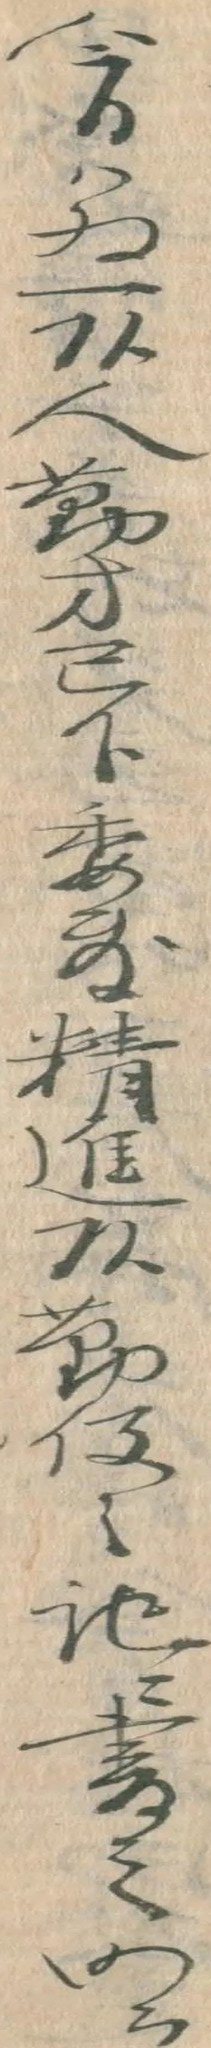今日ハ為一頭人勤方已下委敷精進頭勤役之記ニ書之仍而
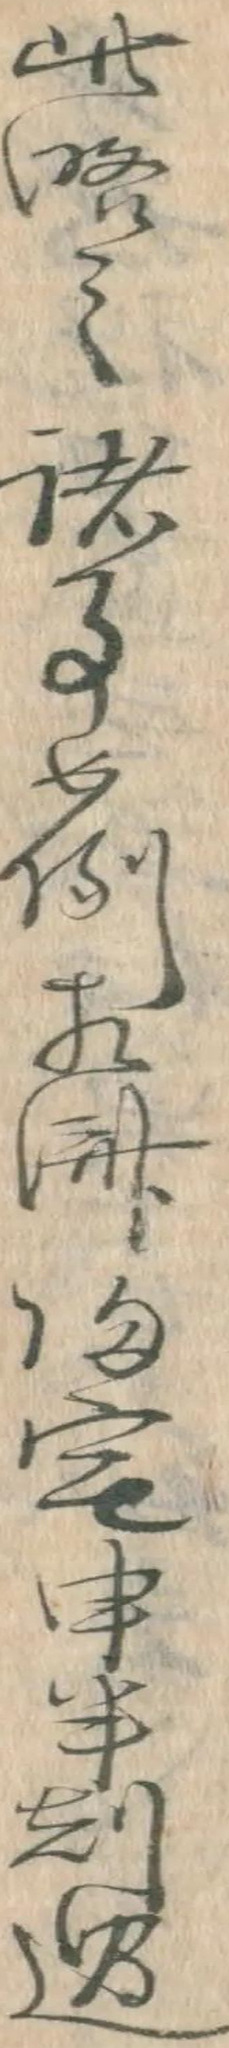此略之諸事如例相済帰宅申半刻過
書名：賀茂社記録. 第64冊
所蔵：国立国会図書館 National Diet Library, JAPAN
